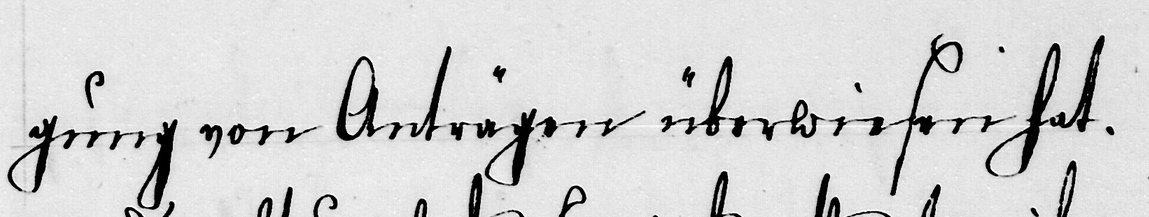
gung von Anträgen überwiesen hat.
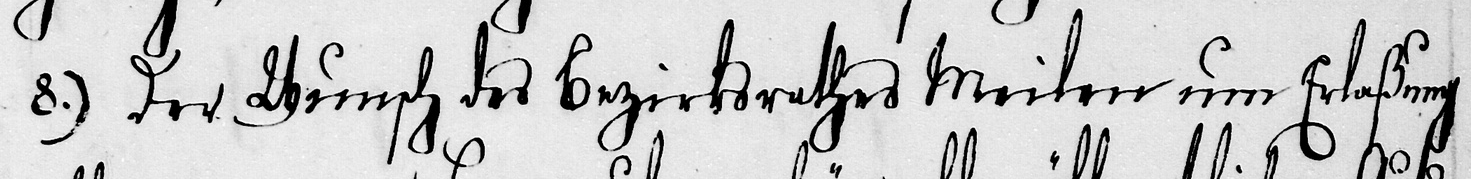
8.) Der Wunsch des Bezirksrathes Meilen um Erlaßung
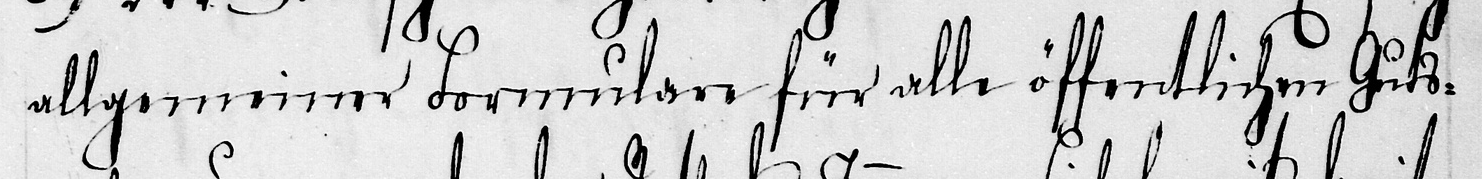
allgemeiner Formulare für alle öffentlichen Guts¬
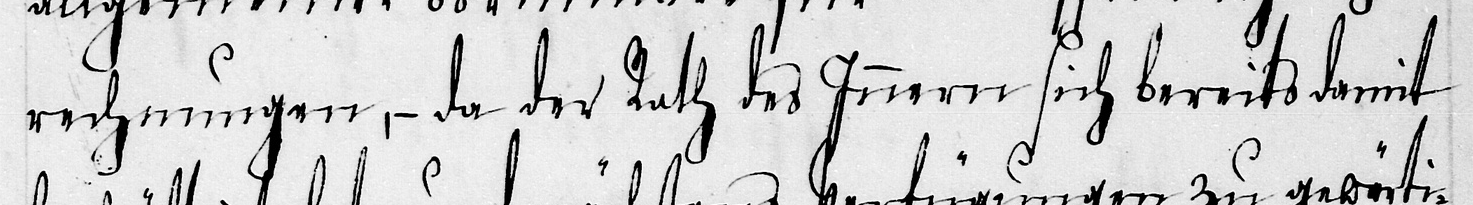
rechnungen, – da der Rath des Innern sich bereits damit
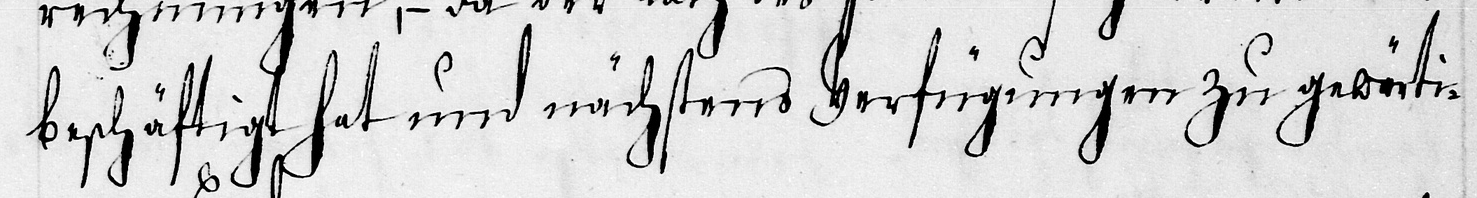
beschäftigt hat und nächstens Verfügungen zu gewärti¬
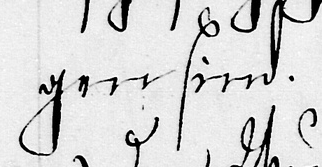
gen sind.
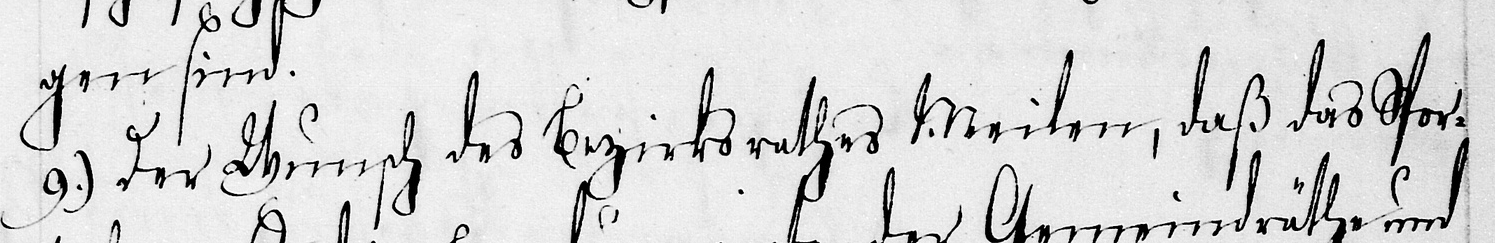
9.) Der Wunsch des Bezirksrathes Meilen, daß das Spor¬
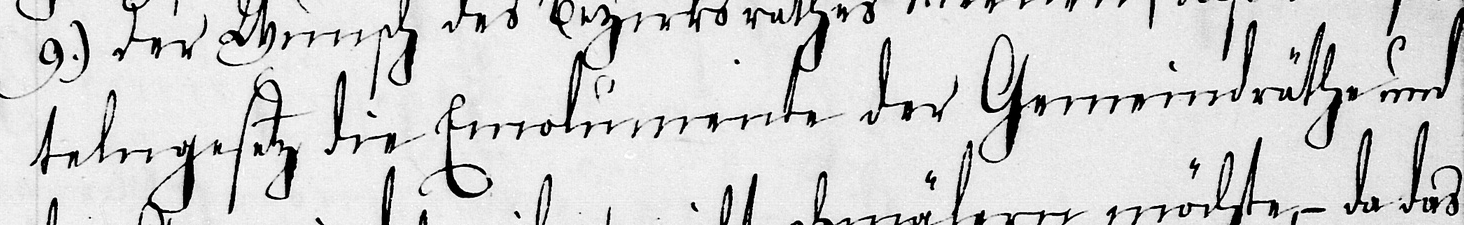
telngesetz die Emolumente der Gemeindräthe und
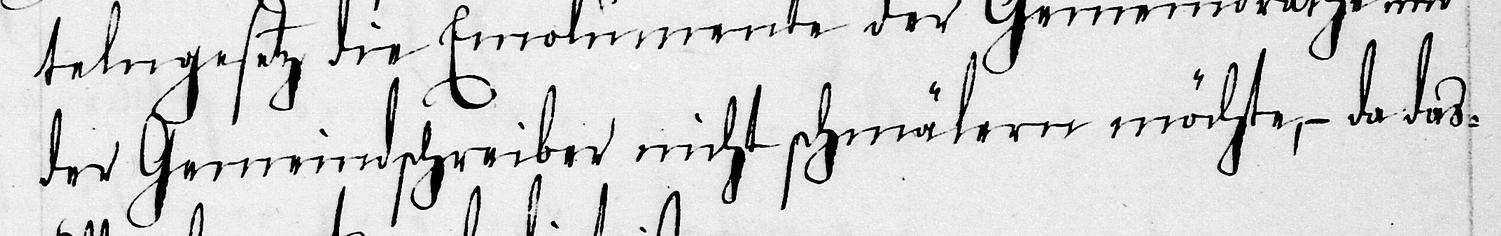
der Gemeindschreiber nicht schmälern möchte, – da das¬
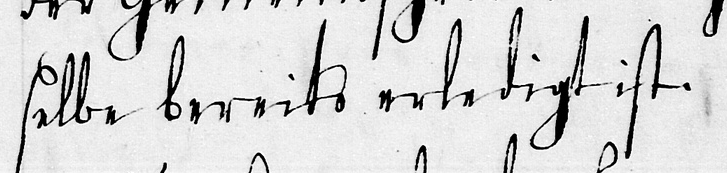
selbe bereits erledigt ist.
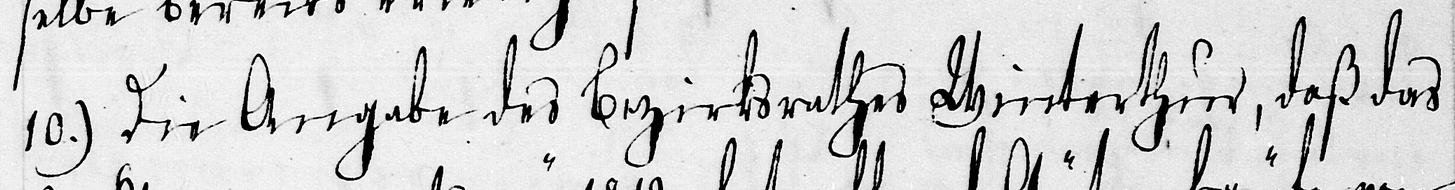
10.) Die Angabe des Bezirksrathes Winterthur, daß das
